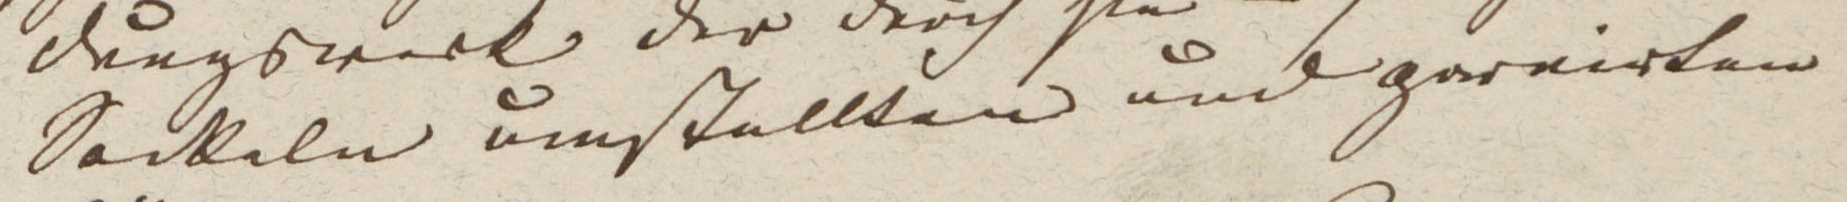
Sockeln umstellten und garnirten
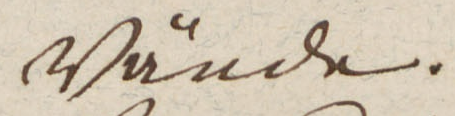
Wände.
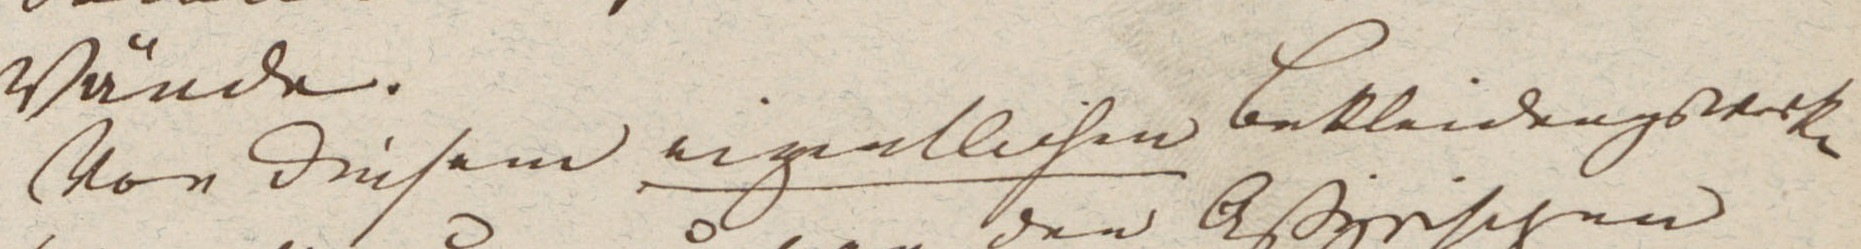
Von diesem eigentlichen Bekleidungswerke
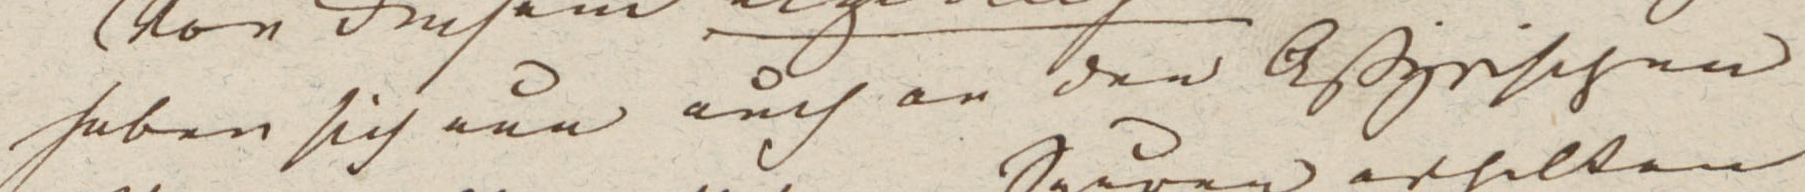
haben sich nun auch an den Assyrischen
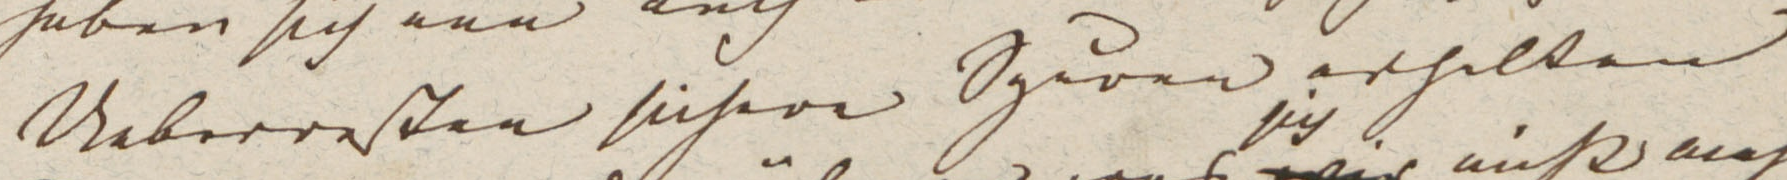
Ueberresten sichere Spuren erhalten
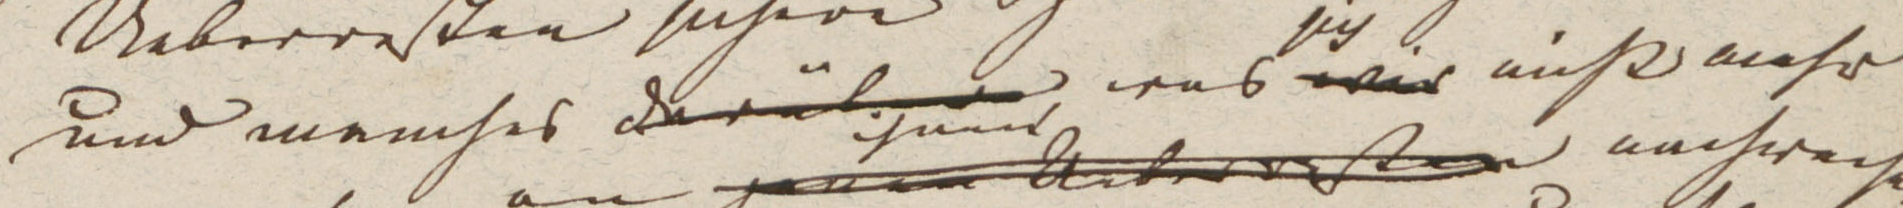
und manches darüber, was wir sich nicht mehr
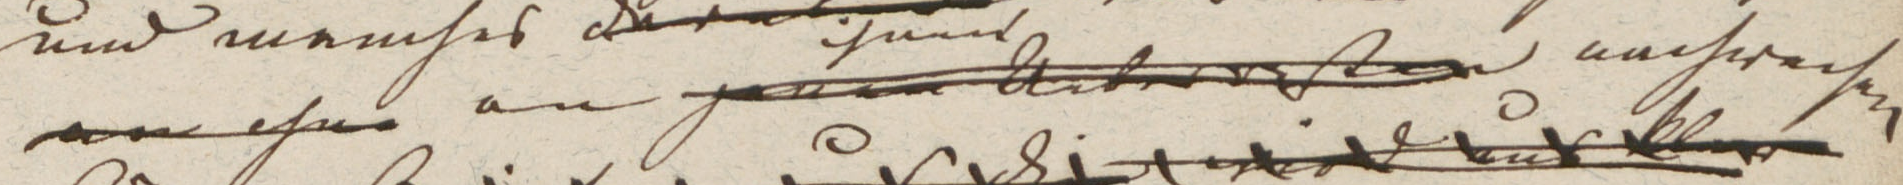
an ihne an jenen Ueberresten ihnen nachweisen
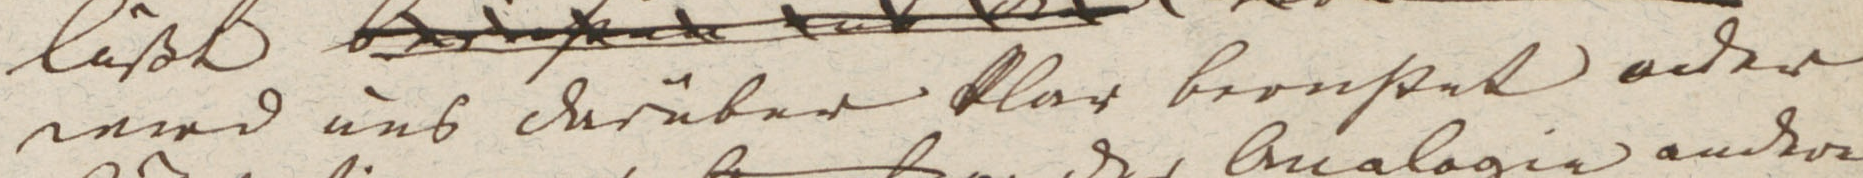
wird uns darüber klar berichtet oder
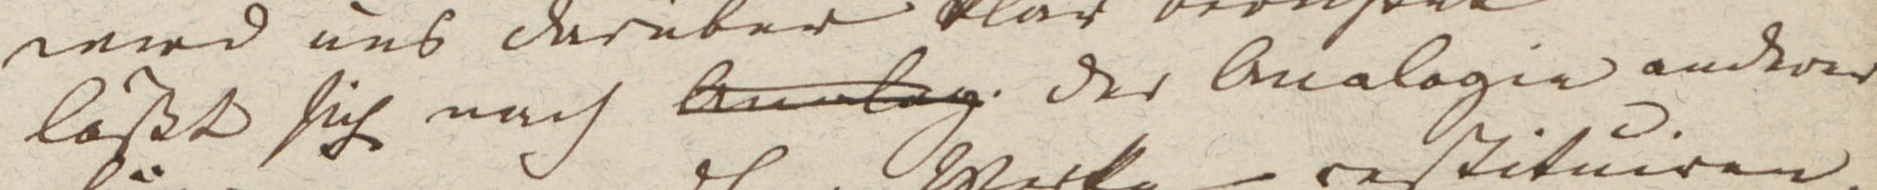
lässt sich nach Analog der Analogie anderer
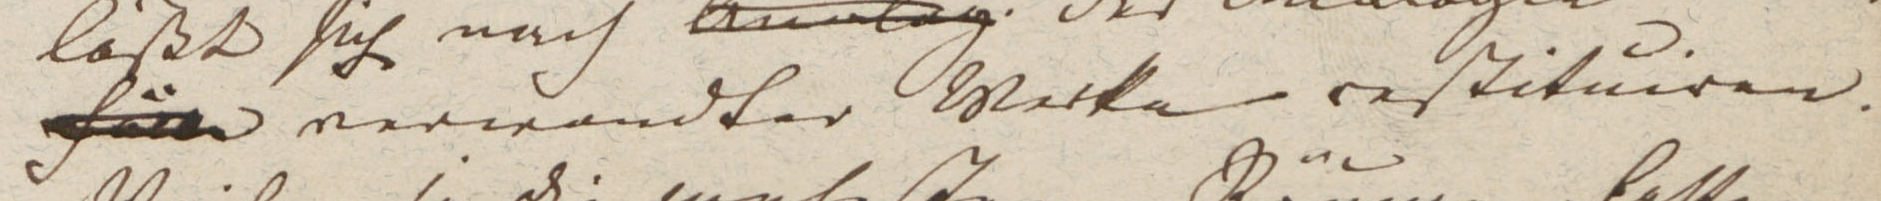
Fälle verwandter Werke restituiren.
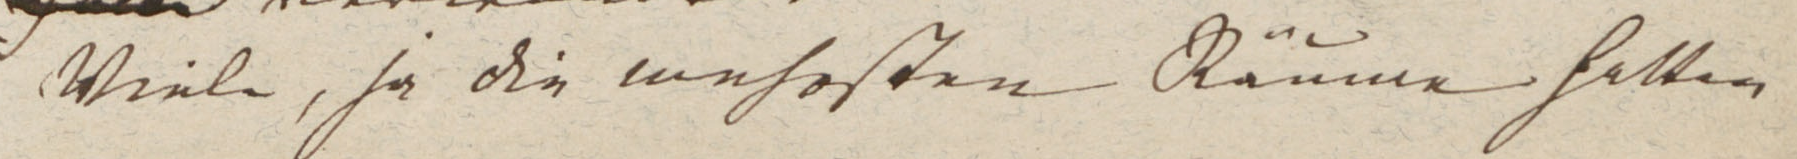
Viele, ja die mehrsten Räume hatten
